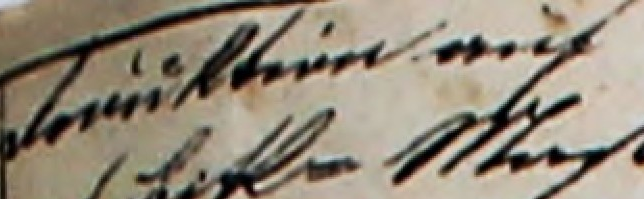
Reduktion auf
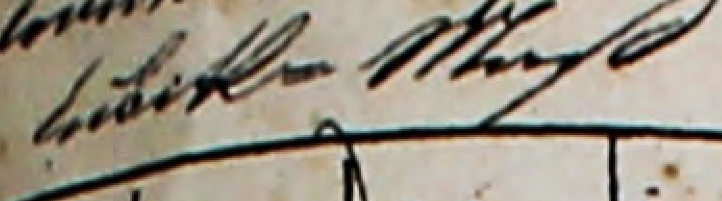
Cubik= Maß
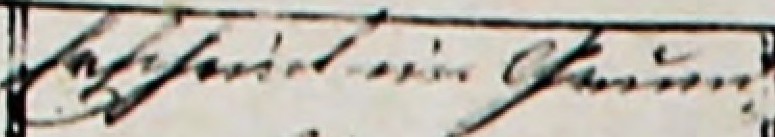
Erscheint im Grund„
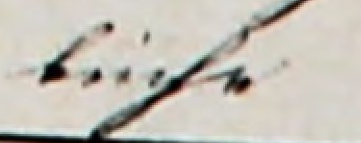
buche
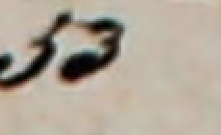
53
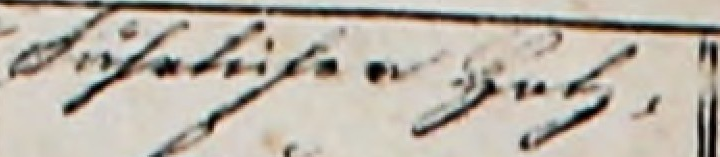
Jährlicher Holz„
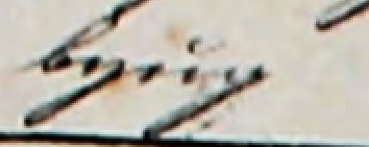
bezug
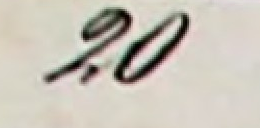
20
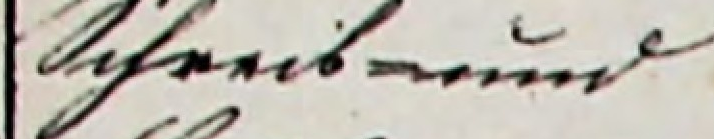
Schreib = und
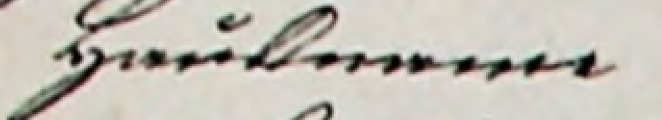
Hausmann
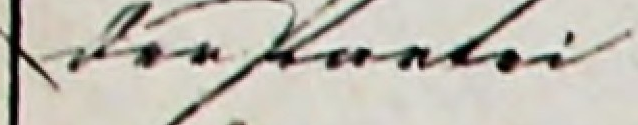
der Partei
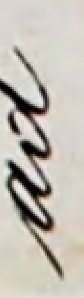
ad
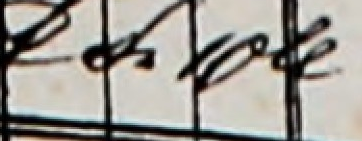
???
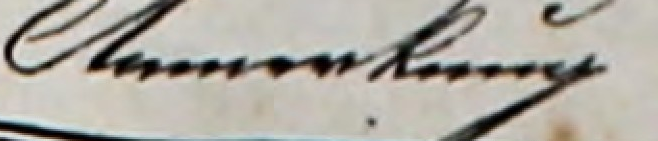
Anmerkung
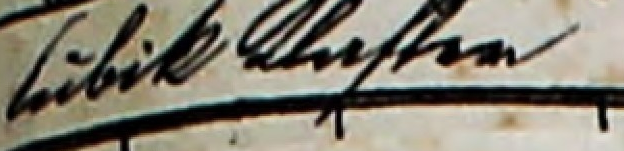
Cubik Klafter
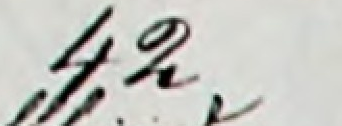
42
